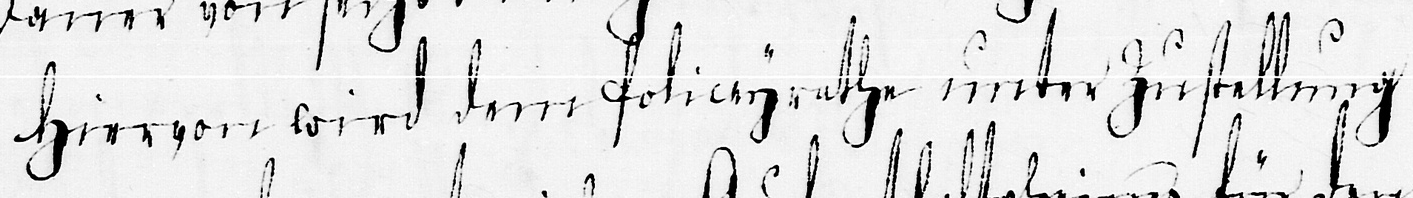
Hiervon wird dem Policeyrathe unter Zustellung
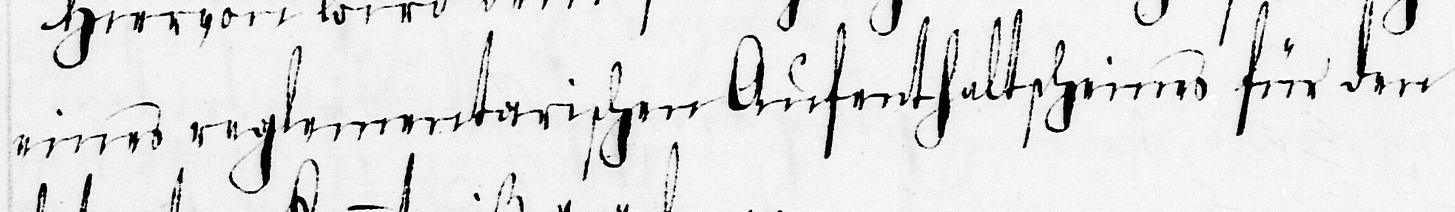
eines reglementarischen Aufenthaltscheines für den
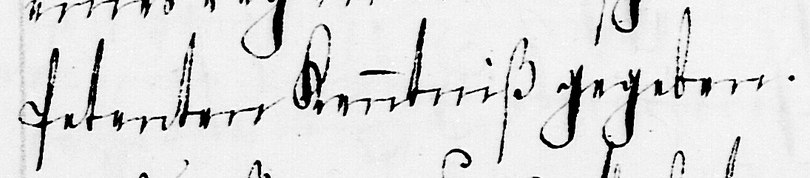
Petenten Kenntniß gegeben.
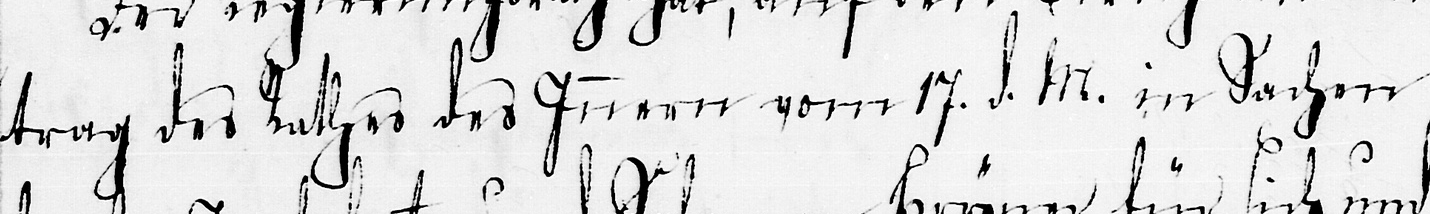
trag des Rathes des Innern vom 17. d. M. in Sachen
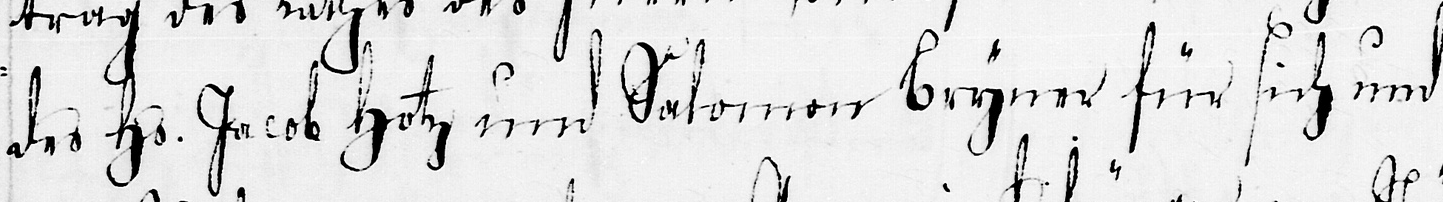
des Hs. Jacob Hotz und Salomon Bryner für sich und
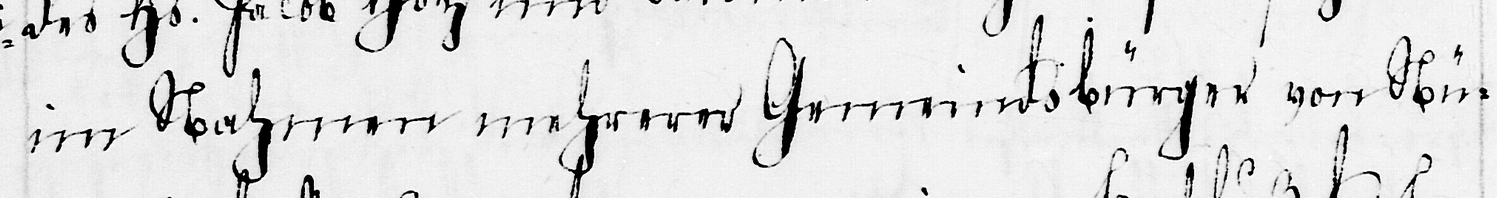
im Nahmen mehrerer Gemeindsbürger von Nü¬
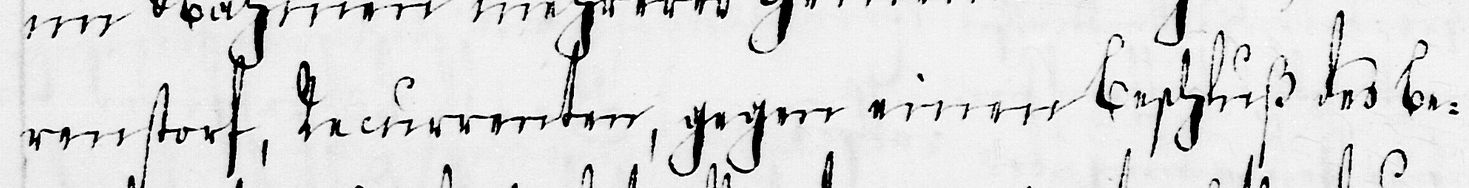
renstorf, Recurrenten, gegen einen Beschluß des Be¬
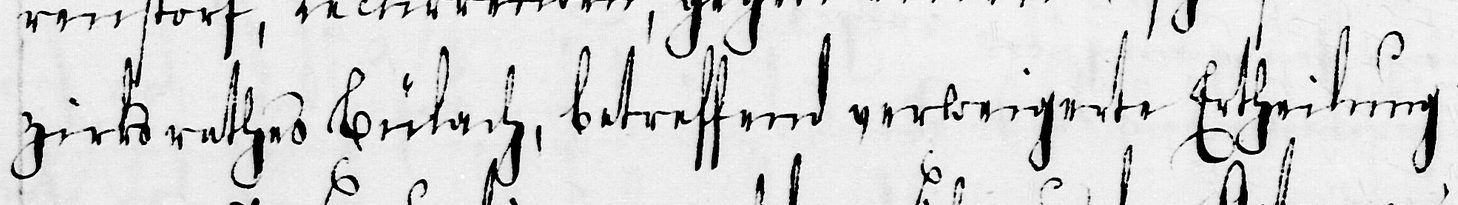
zirksrathes Bülach, betreffend verweigerte Ertheilung
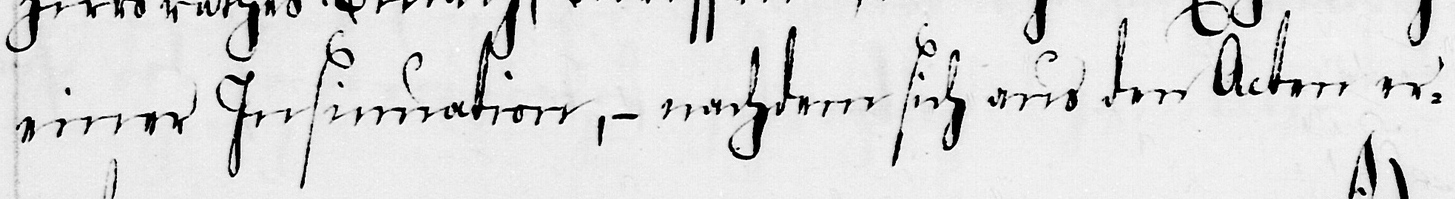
einer Insinuation, – nachdem sich aus den Acten er¬
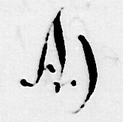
an,
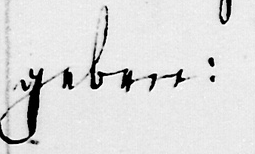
geben:
